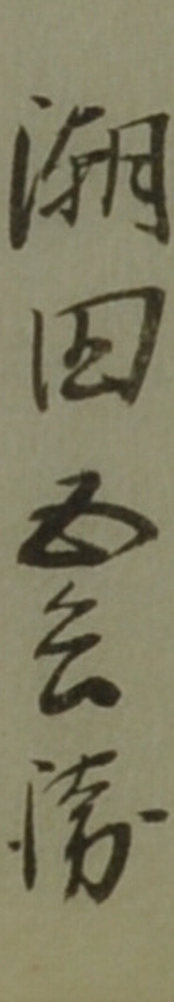瀬田五兵衛
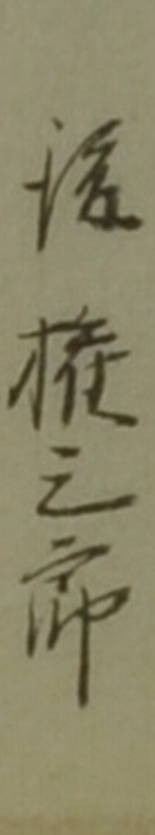後権三郎
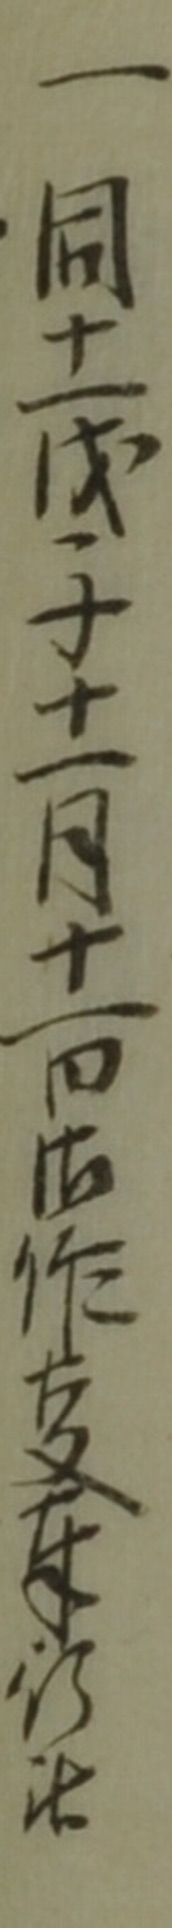一同十一戊子十一月十一日御作事奉行被
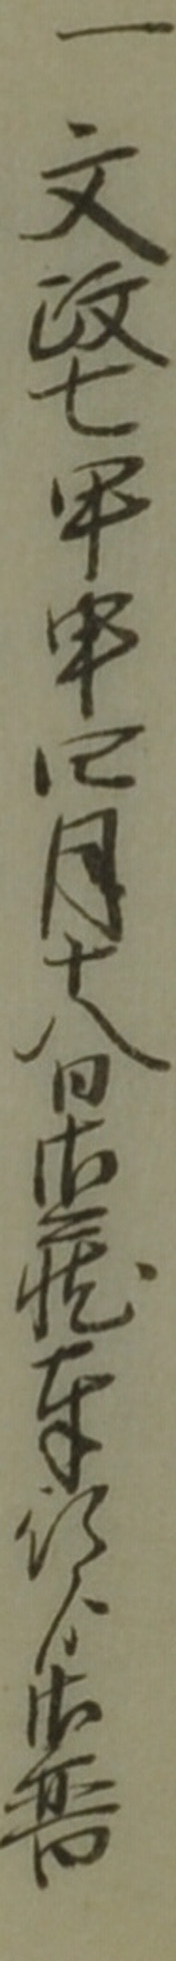一文政七甲申四月十八日御蔵奉行ゟ御普
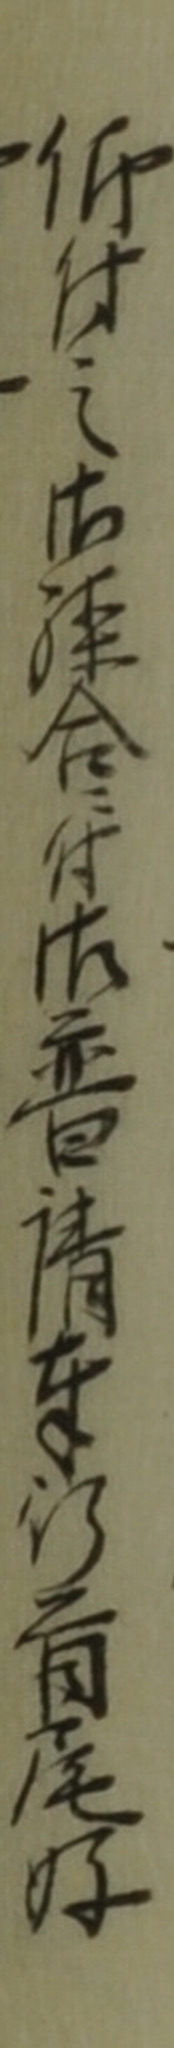仰付之御繰合ニ付御普請奉行首尾好
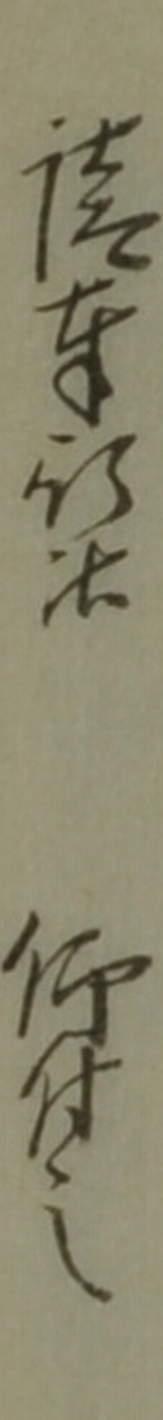請奉行被仰付之
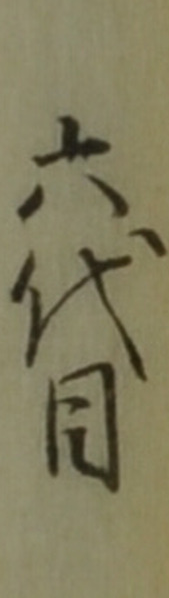六代目
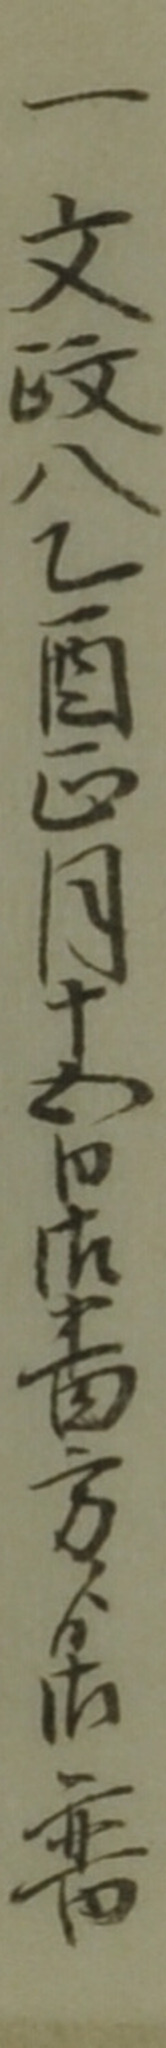一文政八乙酉正月十五日御番方ゟ御普
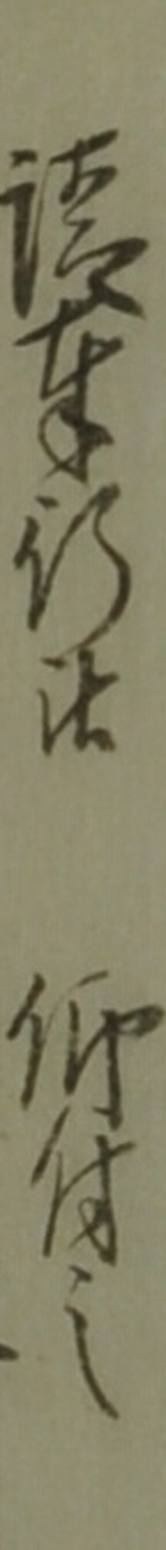請奉行被仰付之
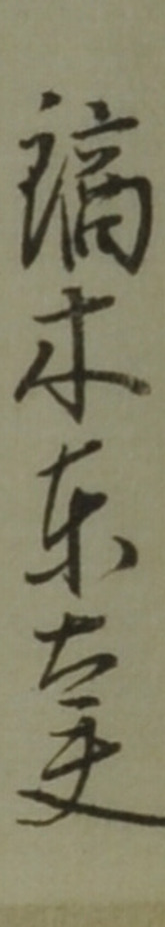鏑木東太夫
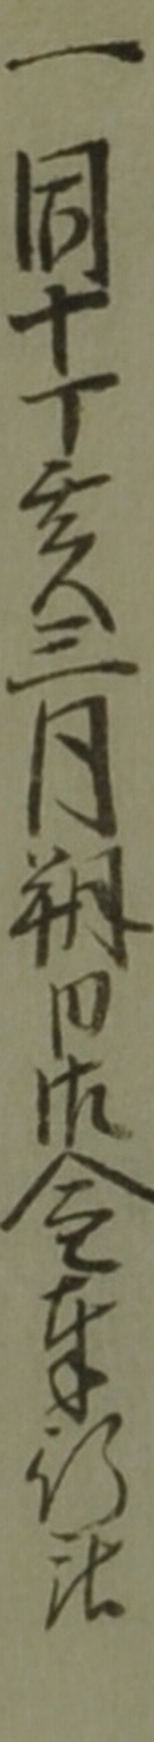一同十丁亥三月朔日御金奉行被
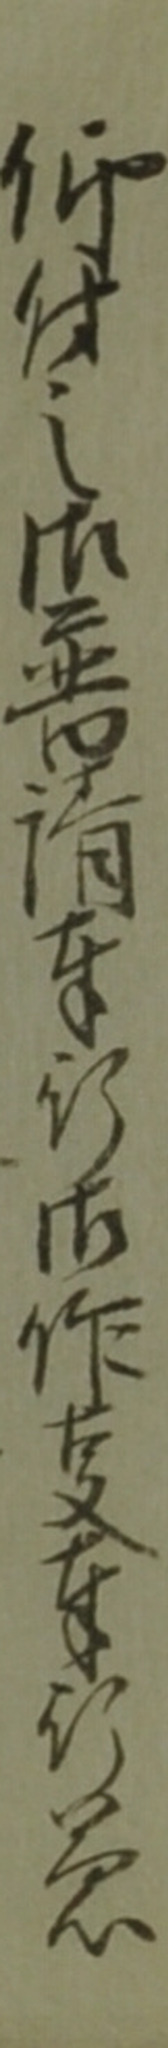仰付之御普請奉行御作事奉行兼
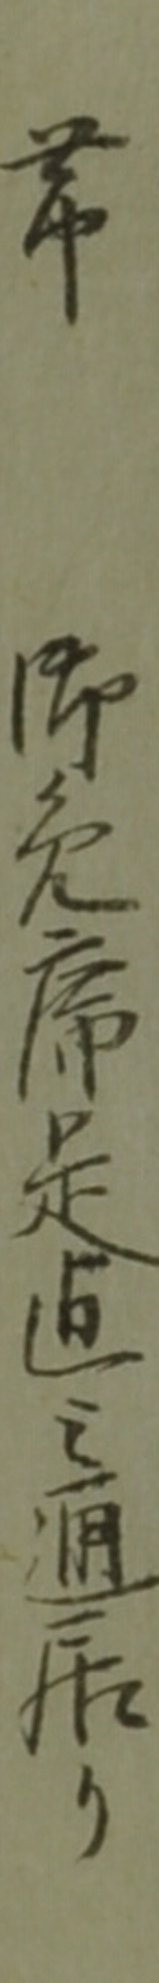帯御免席是迄之通居り
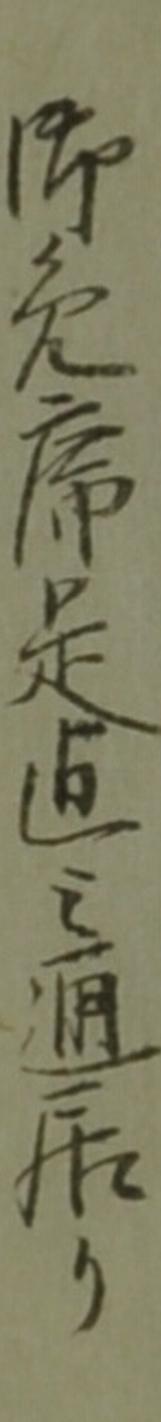帯御免席是迄之通居り
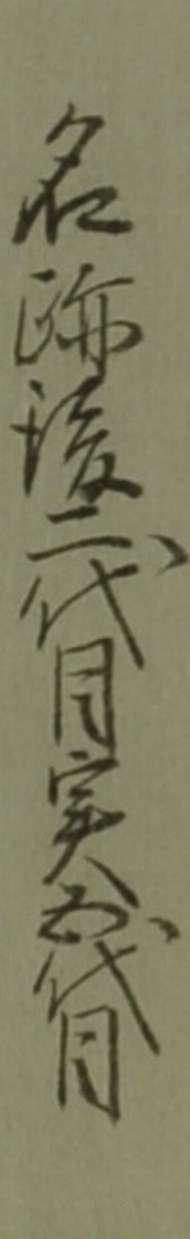名跡後二代目実五代目
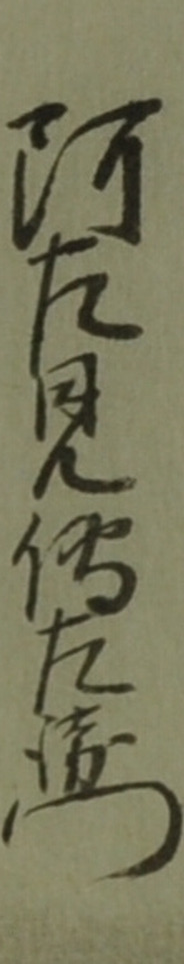阿左見伝左衛門
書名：諸御役代々録（六）
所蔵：伊那市立高遠町図書館・合同会社AMANE
